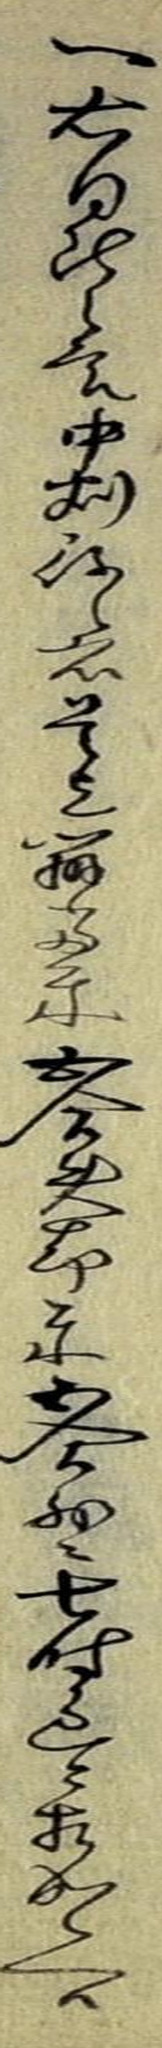一右同断之節中判役之者是迄弁当米五合失却米五合外に七時過に相成候へは
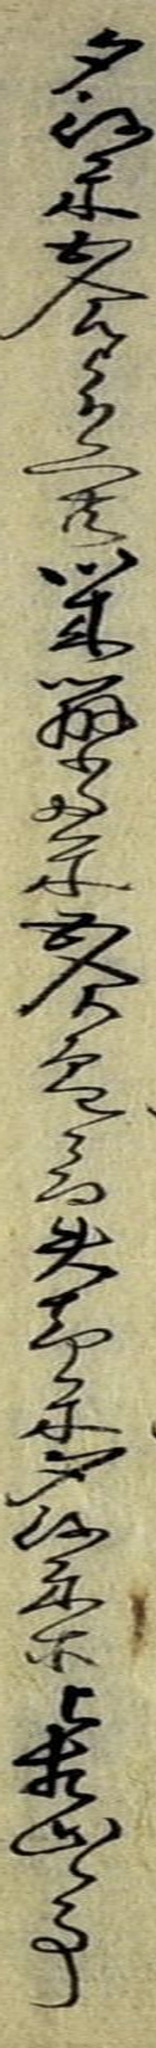夕役米五合被下候へ共以来弁当米五合而己に而失却米夕役米等被相止候事
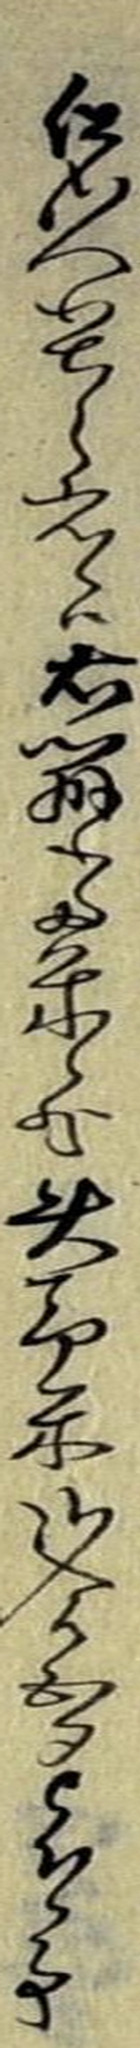但弐人ふち之者には右弁当米之外失却米弐合五夕被下候事
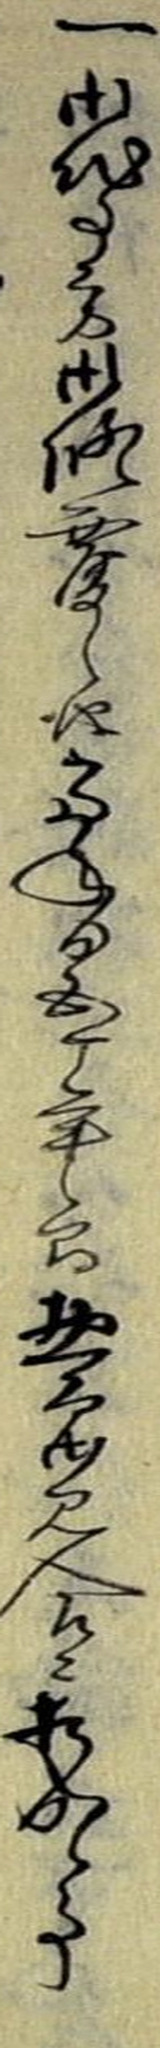一御作事方御修覆之儀当年ゟ五ヶ年之間惣而御見合に相成候事
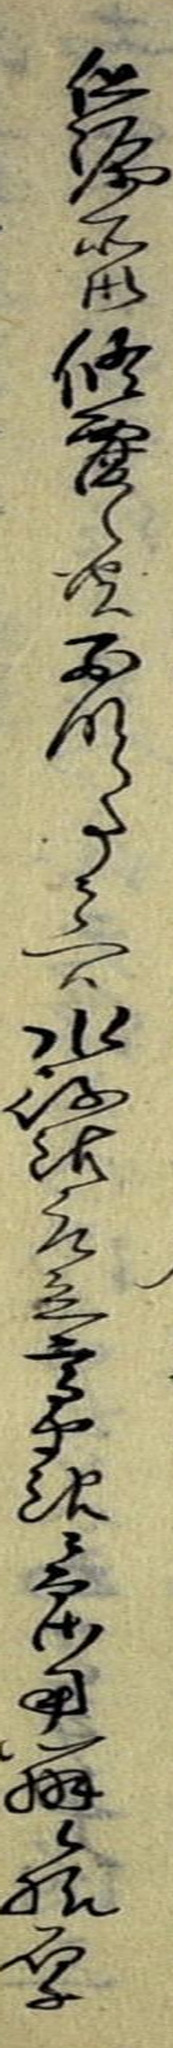但痛所御修覆之儀は別段之事に候へは水役銀取立高半銀に而御用弁候様厚
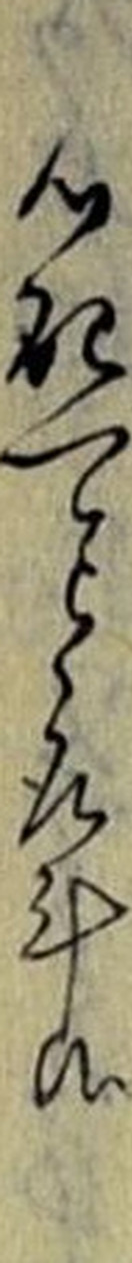心配可被取斗候
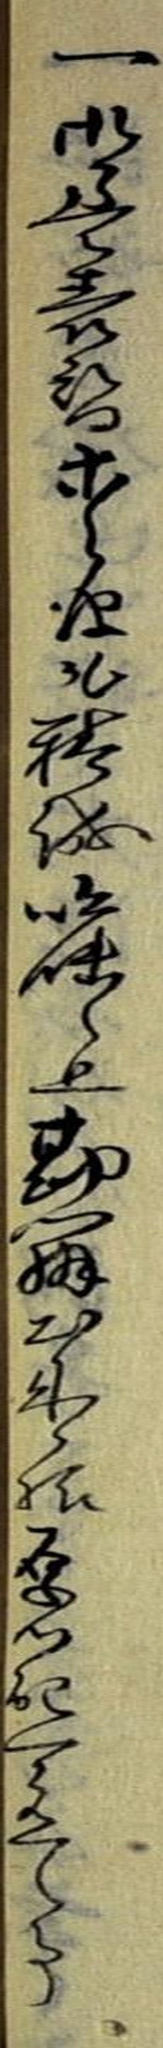一御畳表替等之儀も精誠吟味之上勘弁出来候様厚心配可有之事
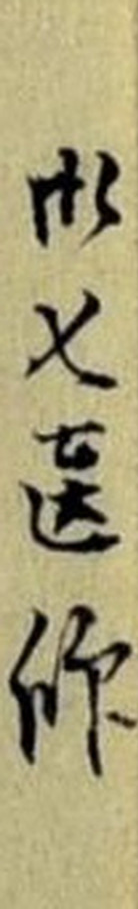御匕医師
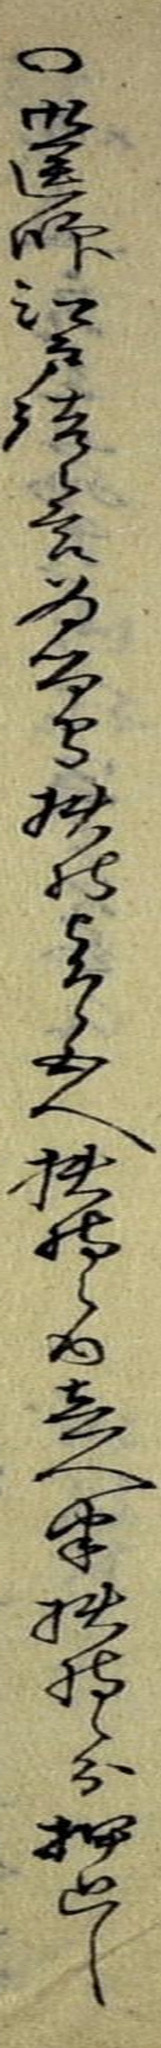○御医師江戸詰之節為留守扶持被下五人扶持之内壱人半扶持之分押廻し
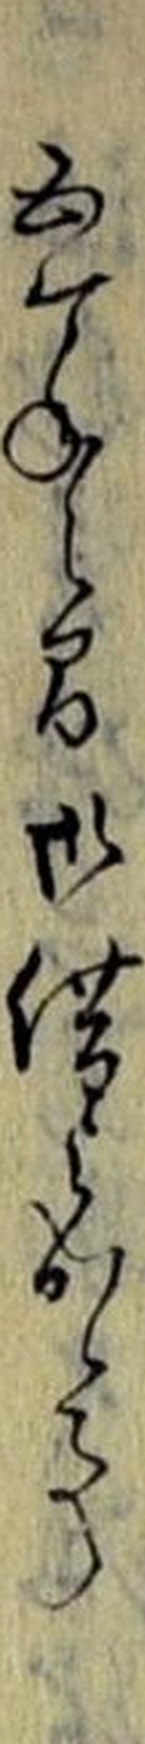五ヶ年之間御借被成候事
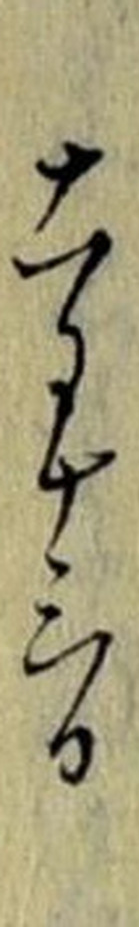十一月十三日
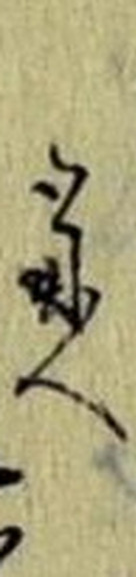御用人
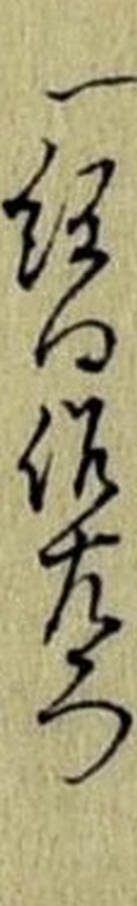飯田作左衛門
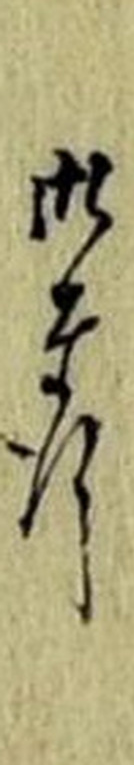御奉行
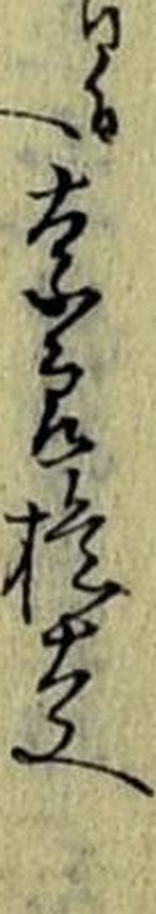奈良権太夫
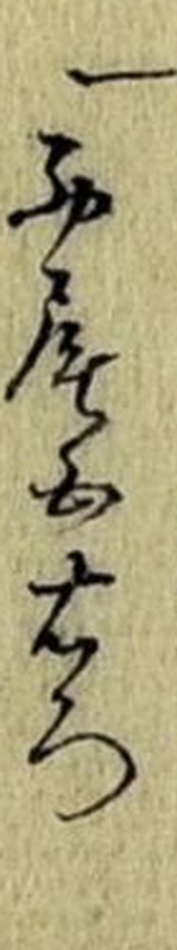西尾五右衛門
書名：命令之部 六
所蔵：福井県文書館 Fukui Prefectural Archives
